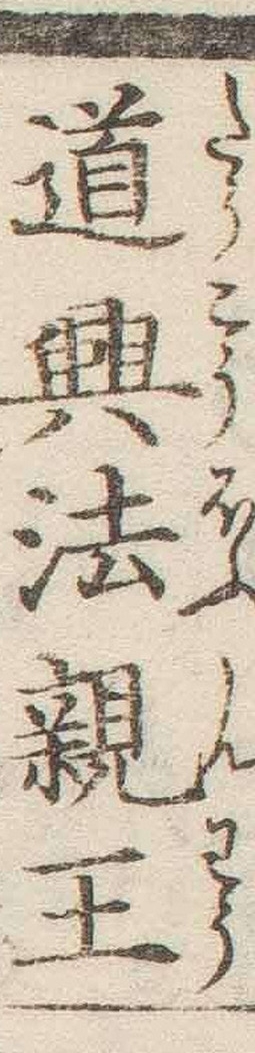道興法親王
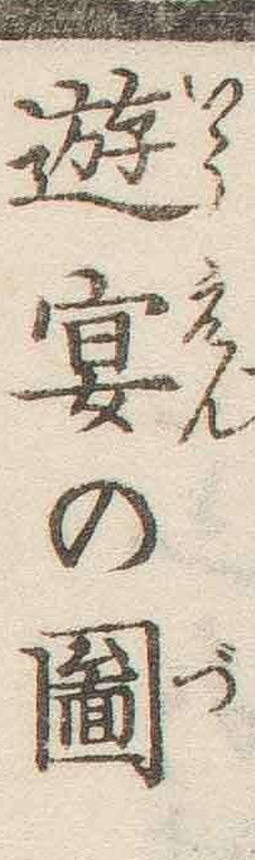遊宴の圖

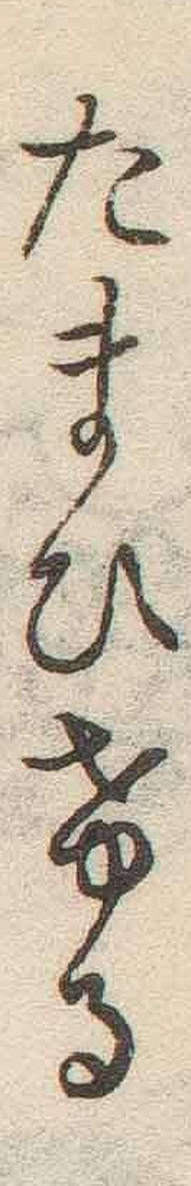たまひける
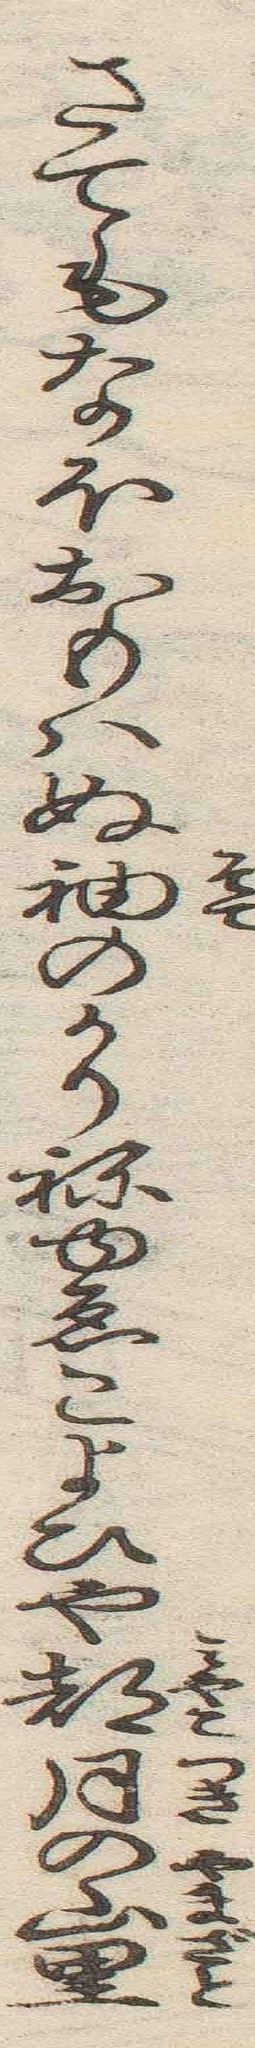さてもなほおもはぬ袖のかりねゆゑこよひや都月の山里
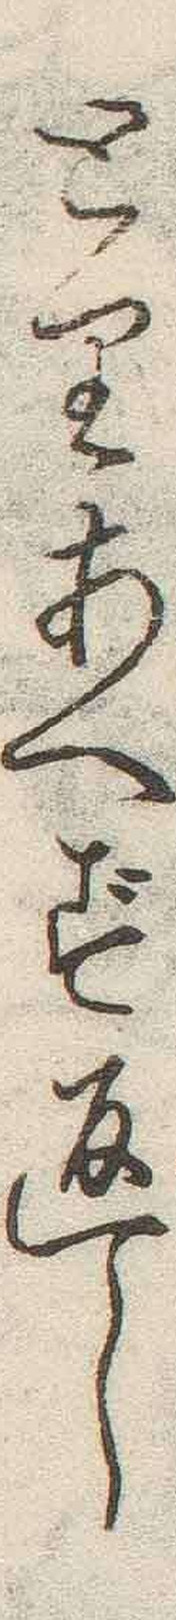とりあへず返し
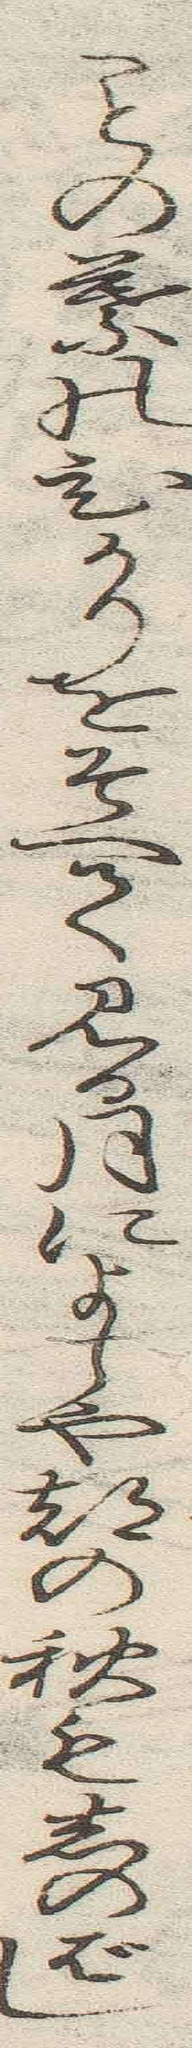ことの葉のひかりをそへて見る月によしや都の秋もしのばし
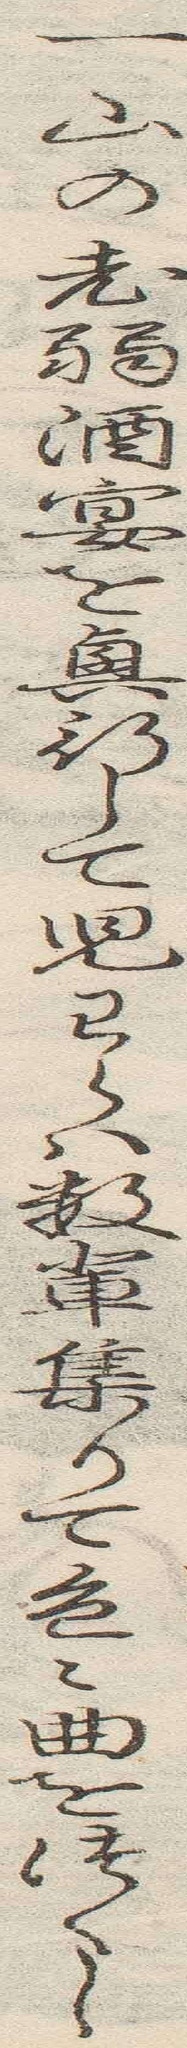一山の老弱酒宴を興行して児わらは数輩集りて色〻曲をつくし
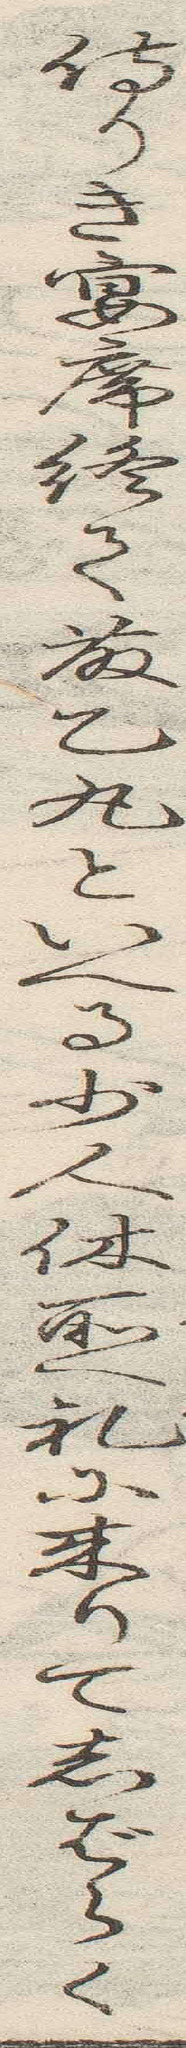侍りき宴席終て藤乙丸といへる少人休所へ礼に来りてしばらく
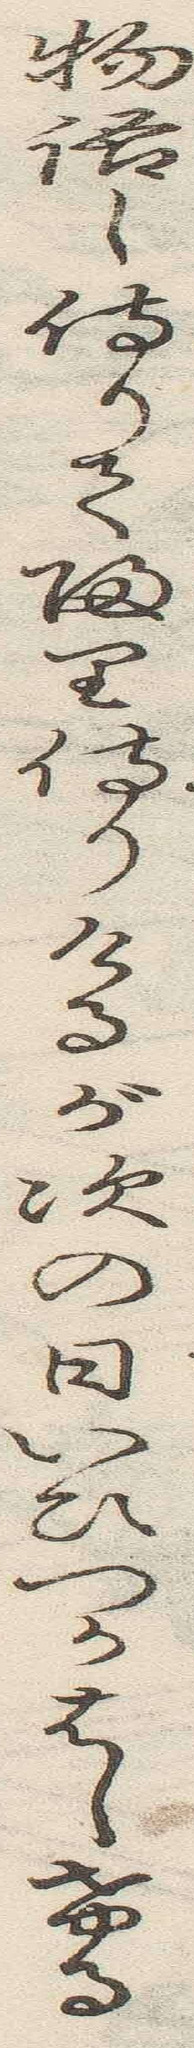物語し侍りて帰り侍りけるが次の日いひつかはしける
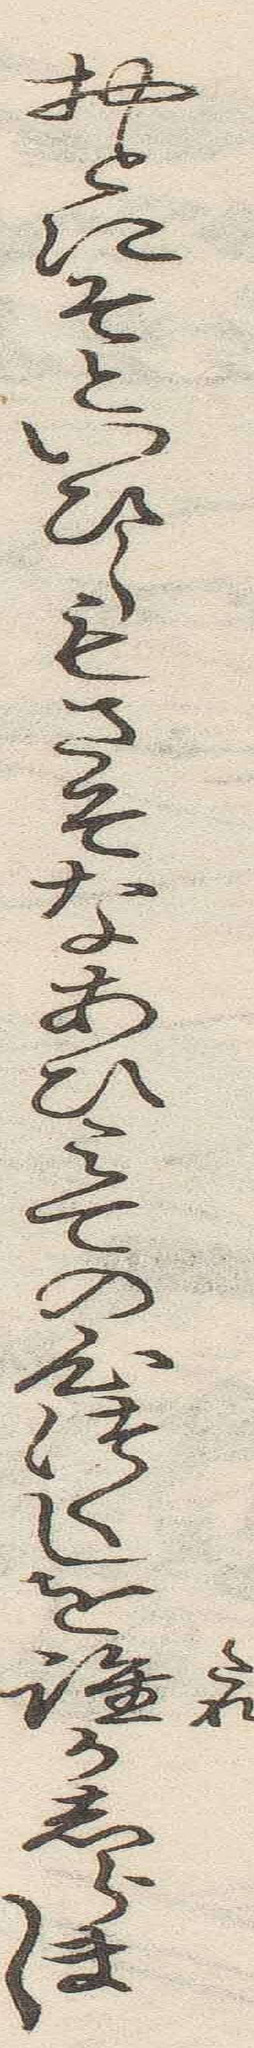おとにそといひしもさそなあひみての心つくしを誰かしらまし
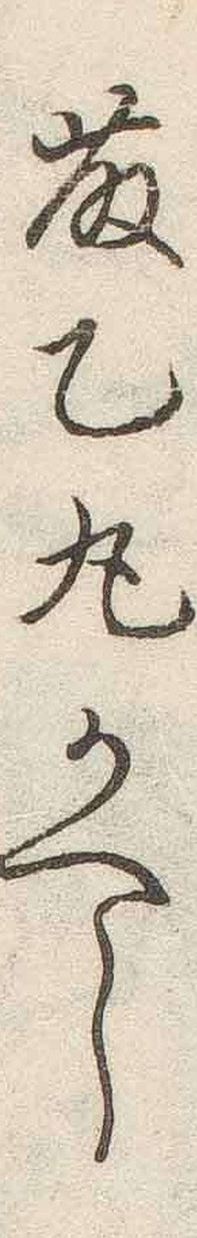藤乙丸かへし
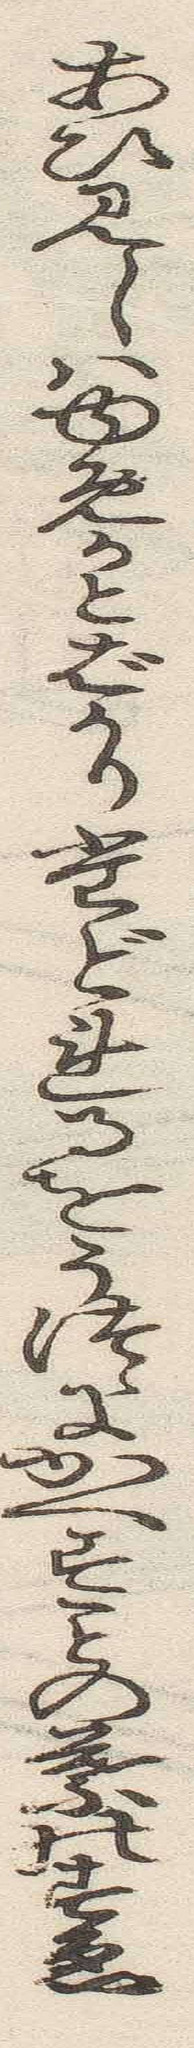あひ見しはゆめかとばかりたどれるをうつにかへすことの葉のすゑ
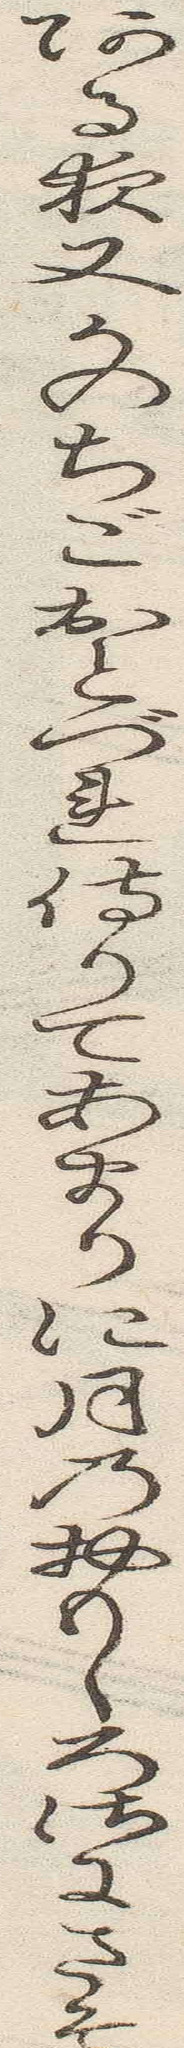ある夜又かのちごおとづれ侍りてあまりに月のおもしろさにさそ
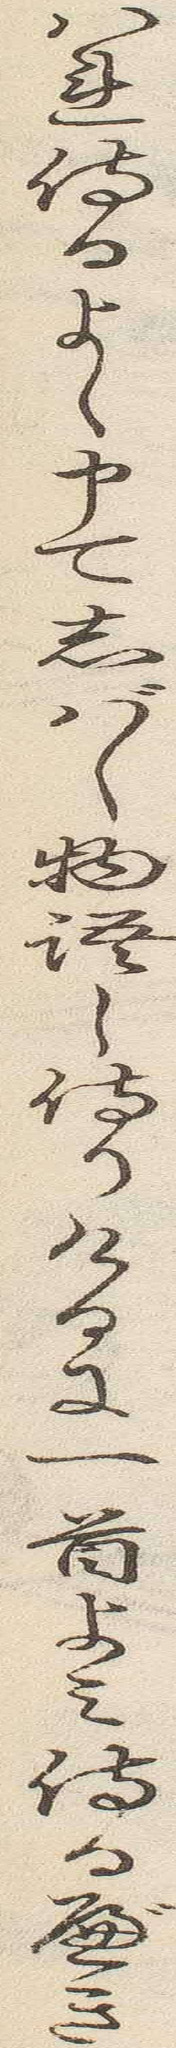はれ侍るよし申てしばし物語し侍りけるに一首よみ侍るべき
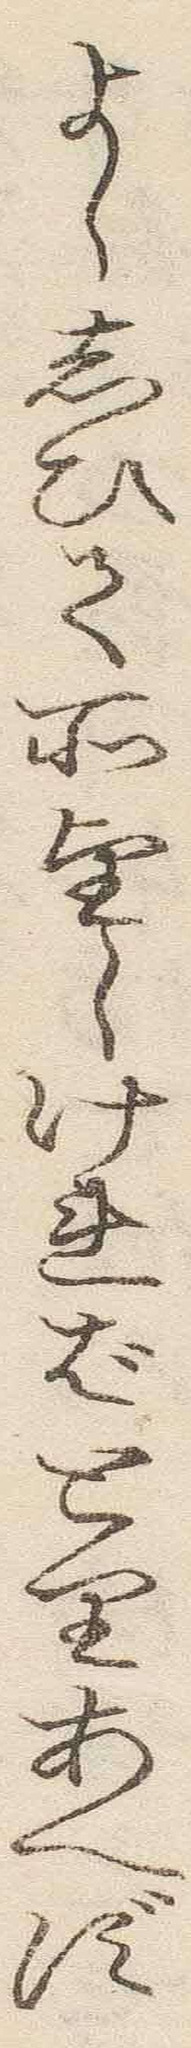よししひて所望しければとりあへず
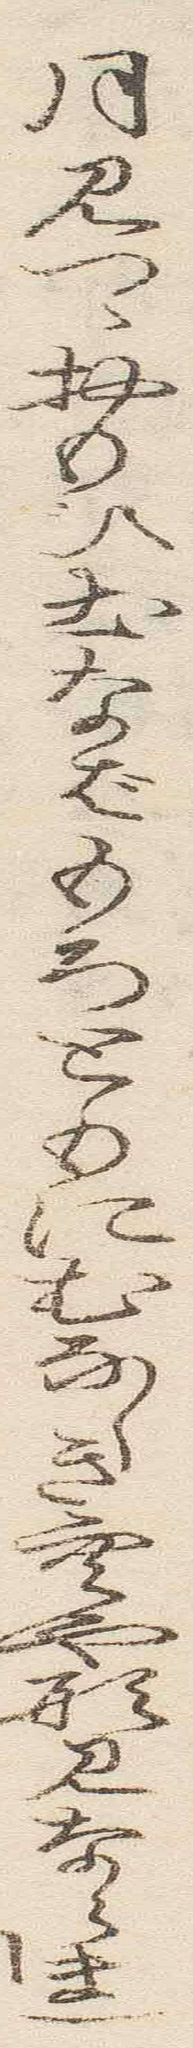月見つゝおもひ出なばもろともにむなしき空や形見ならまし
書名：日光山志
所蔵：東京学芸大学附属図書館 国文学研究資料館
